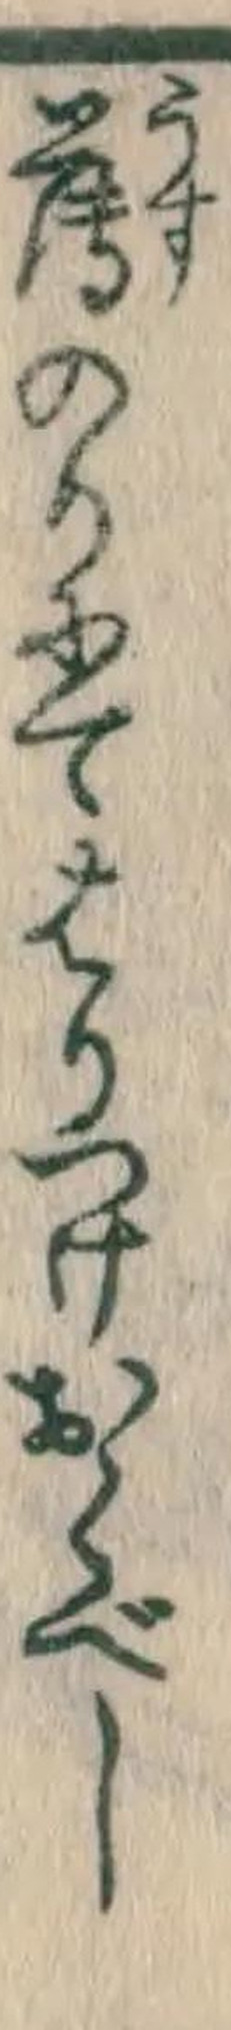薄のりにてはりつけおくべし
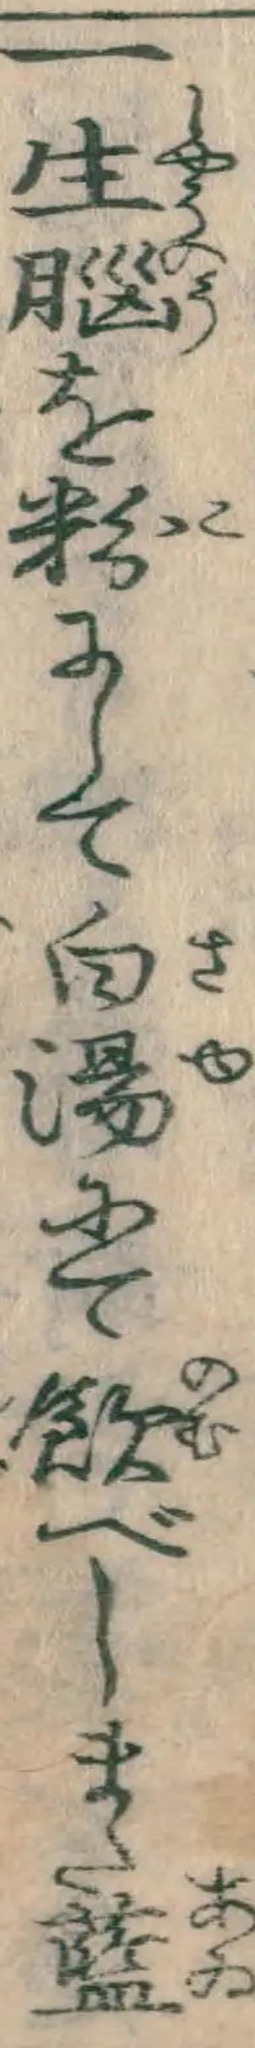一生脳を粉にして白湯にて飲べしまた藍
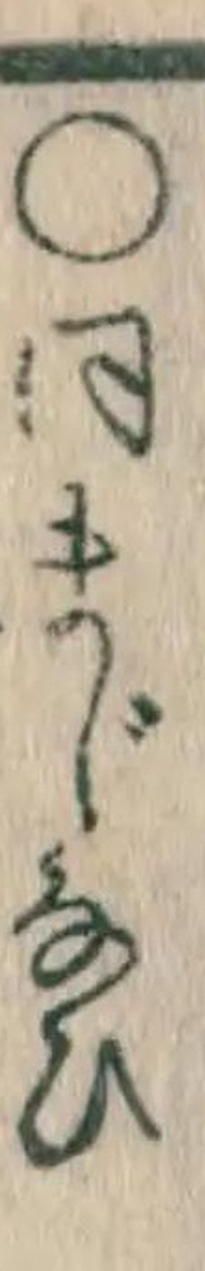○同まじなひ
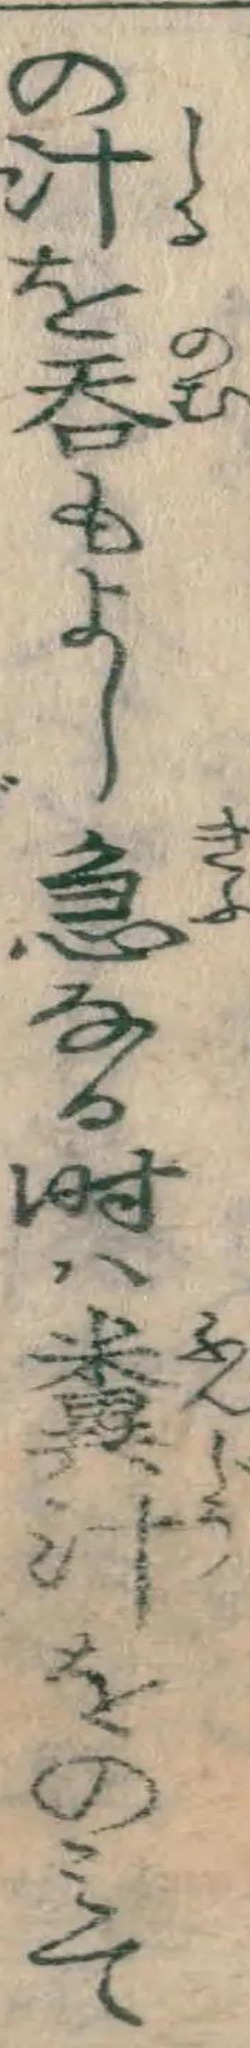の汁を呑もよし急なる時は糞汁をのみて
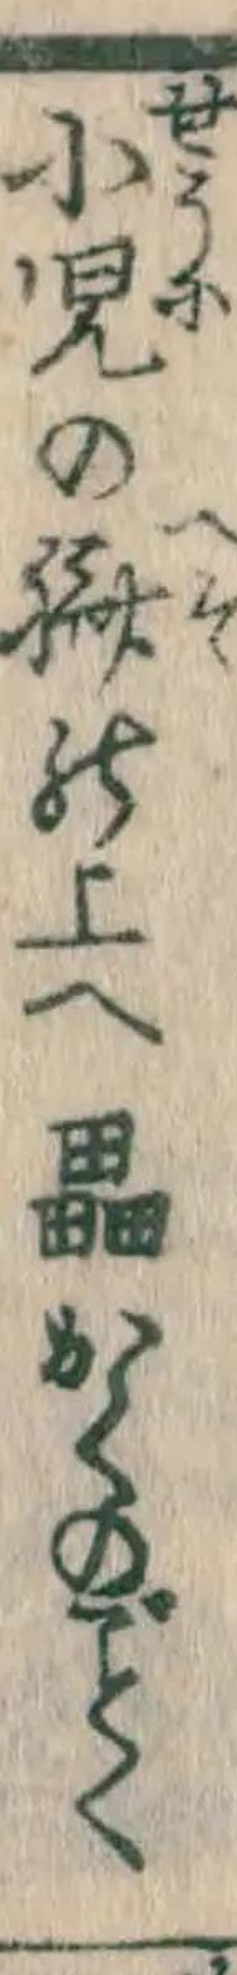小児の臍の上へかくのごとく
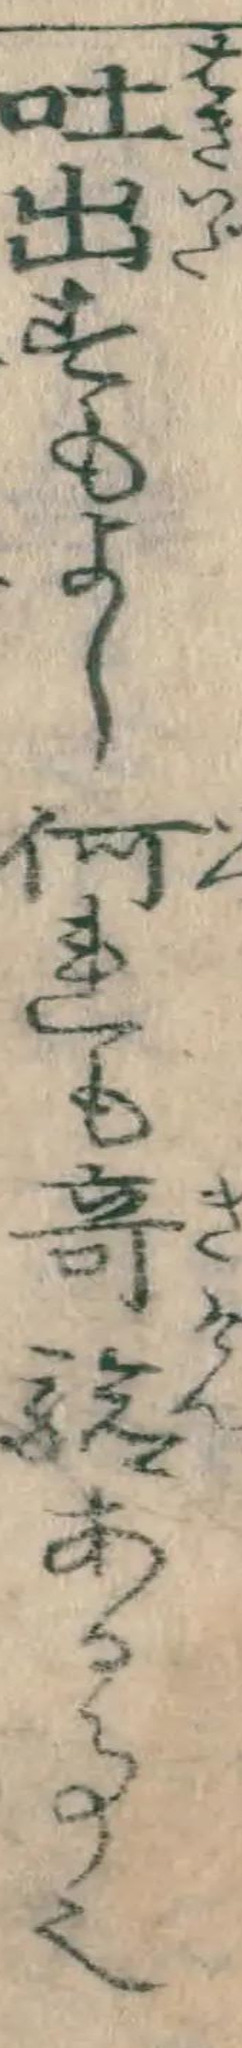吐出すもよし何れも奇験ある事也
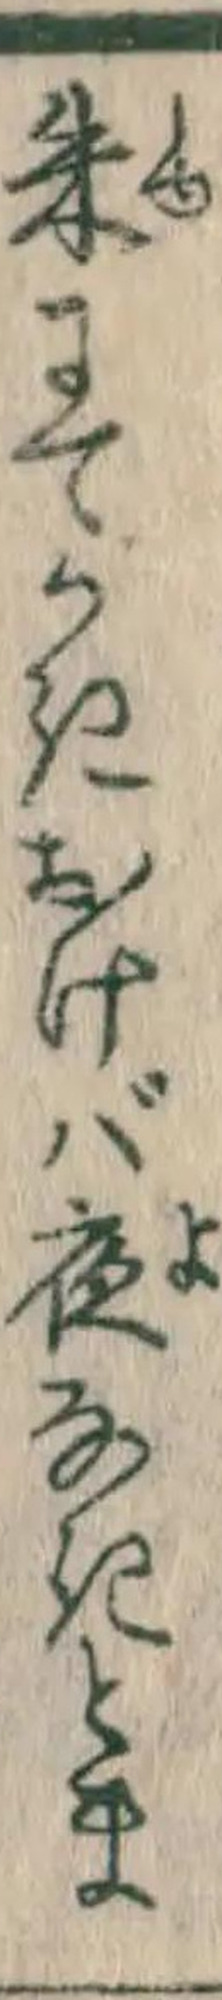朱にてかきおけば夜なきとま
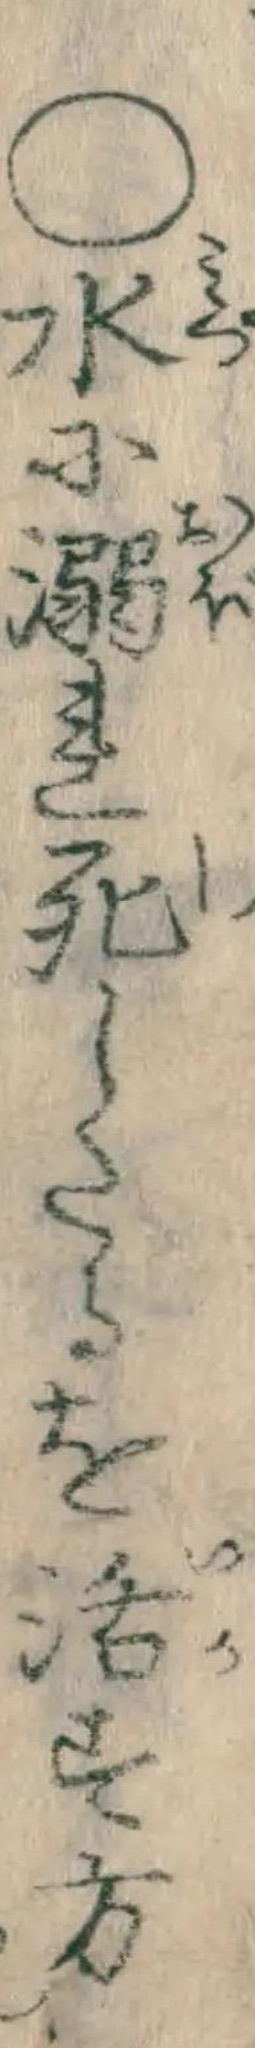○水に溺れ死したるを活す方
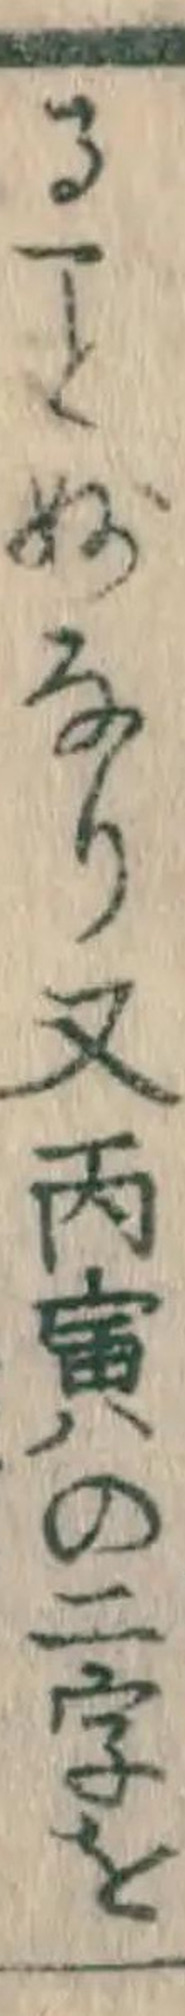ること妙なり又丙寅の二字を
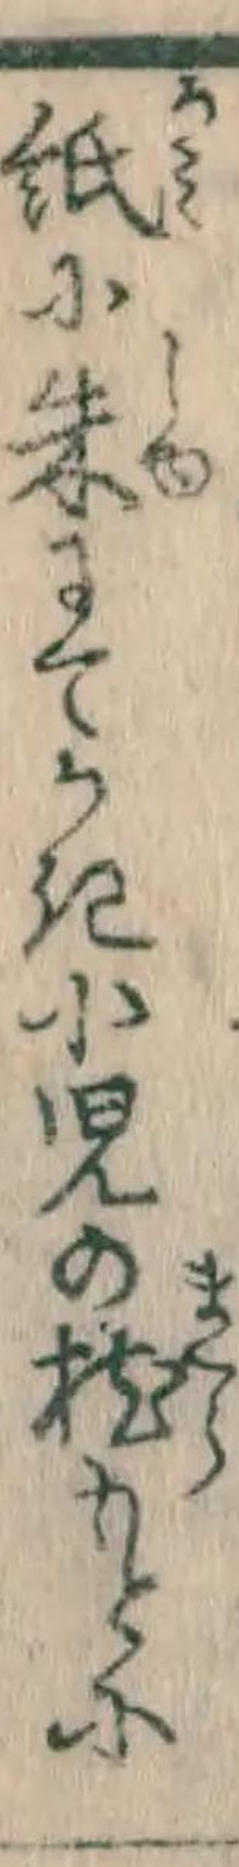紙に朱にてかき小児の枕もとに
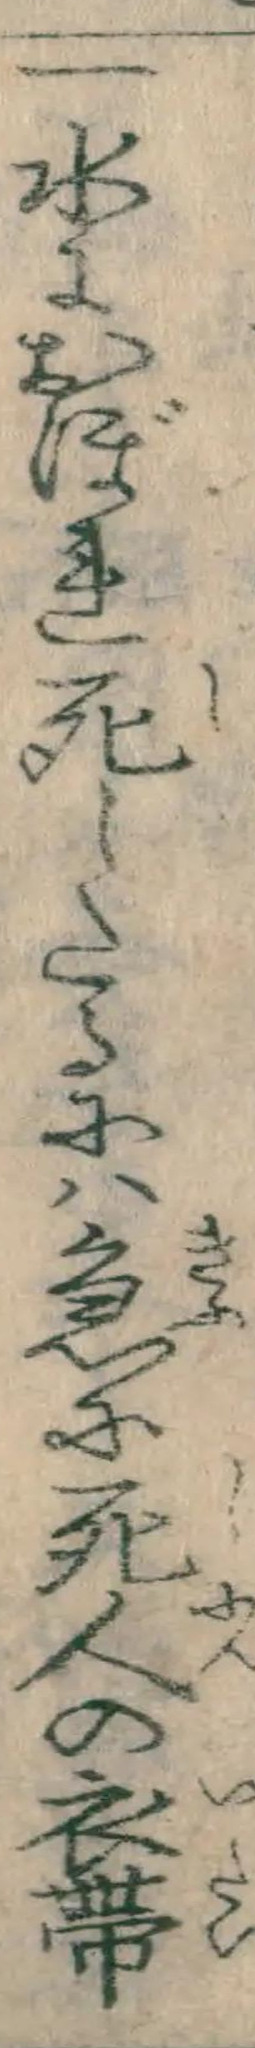一水におぼれ死したるには急に死人の衣帯

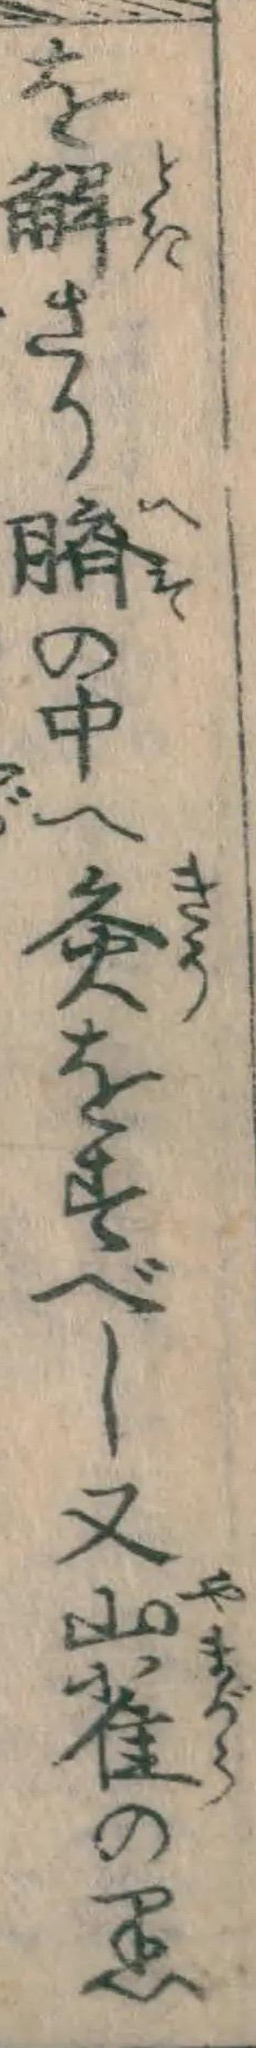を解さり臍の中へ灸をすべし又山雀の黒
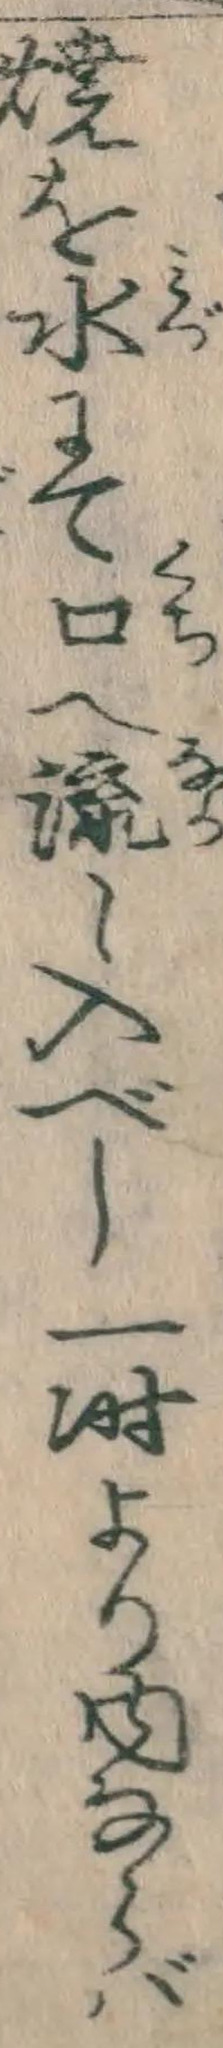焼を水にて口へ流し入べし一時より内ならば
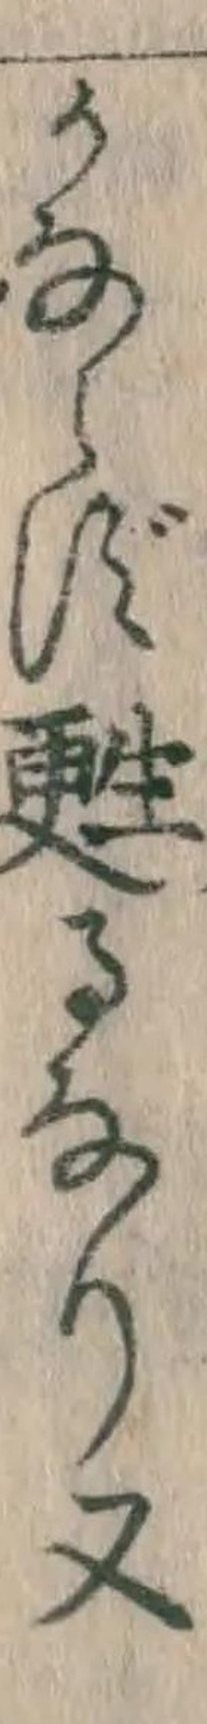かならず甦るなり又
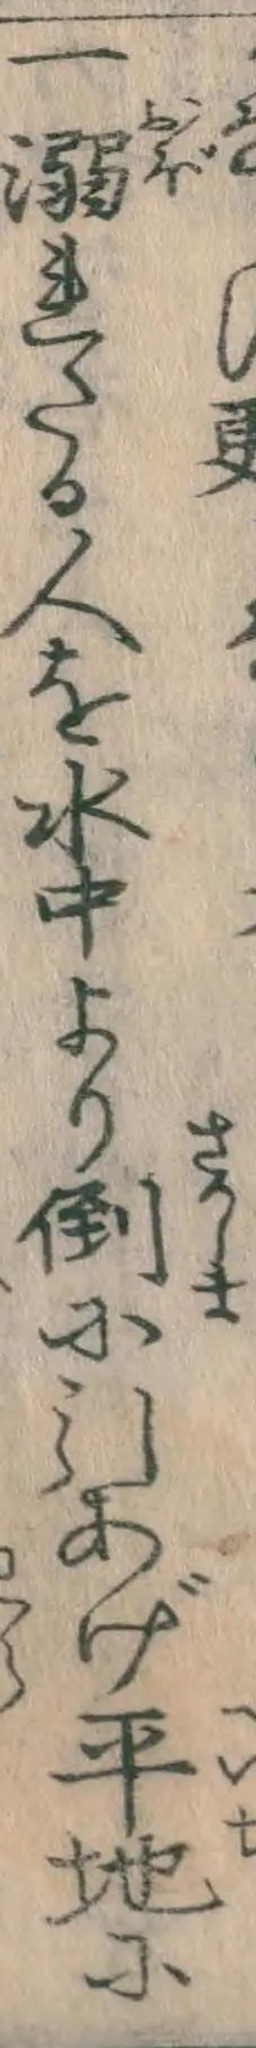一溺れたる人を水中より倒に引あげ平地に
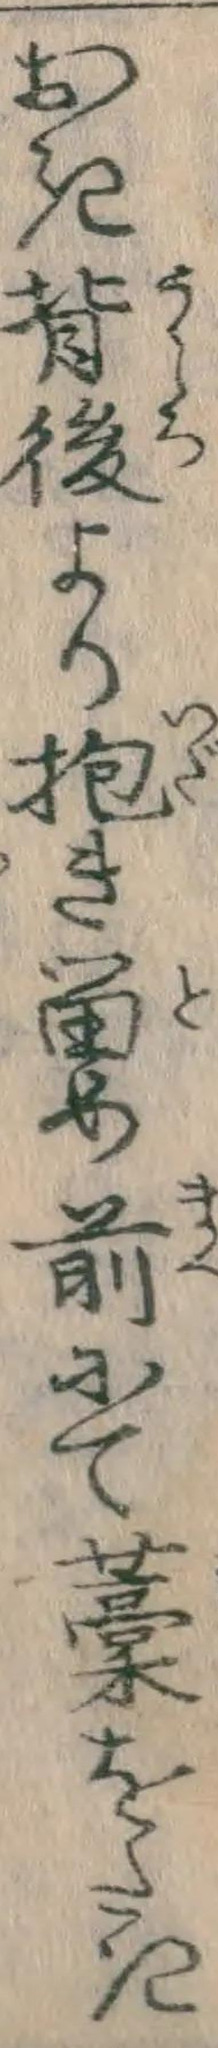おき背後より抱き留め前にて藁をたき
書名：広益秘事大全 3巻. [4]
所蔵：国立国会図書館 National Diet Library, JAPAN
